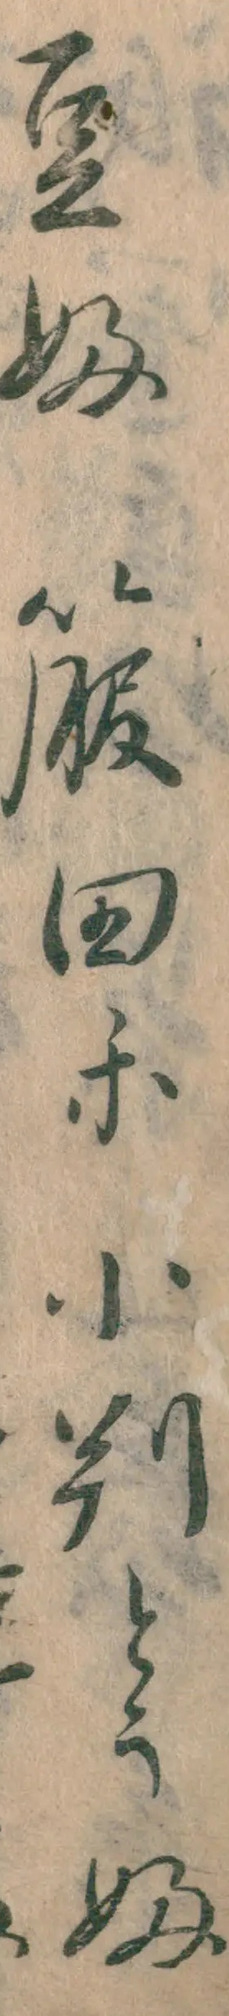豆ふ箙田楽小判とうふ
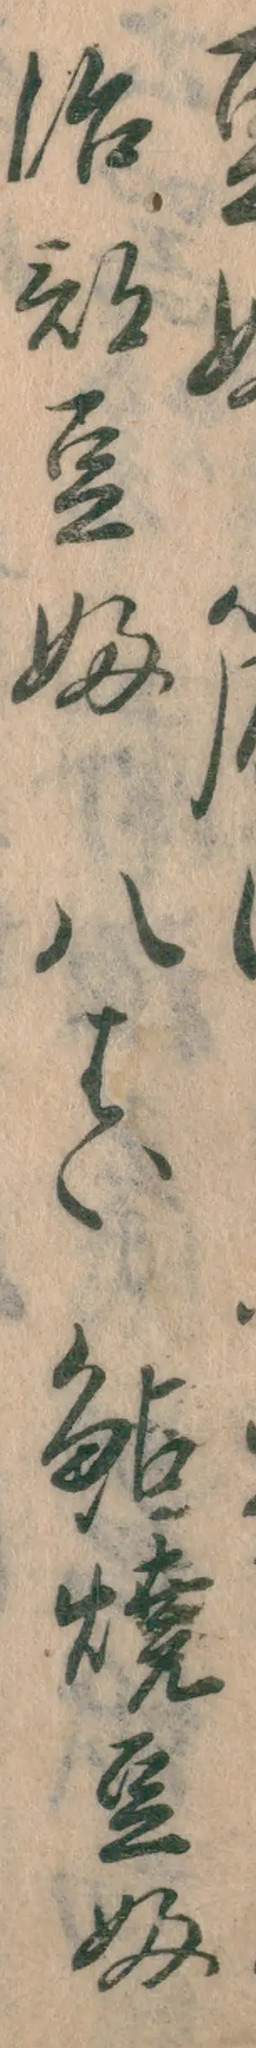治部豆ふ八はい鮎焼豆ふ
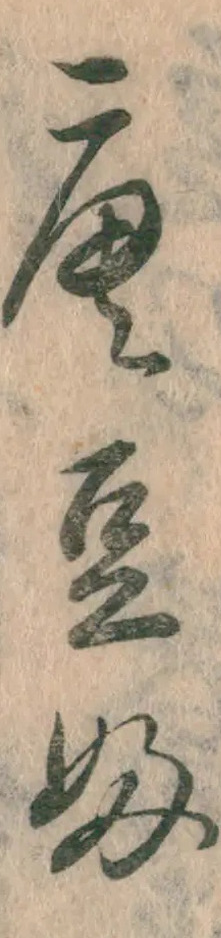唐豆ふ
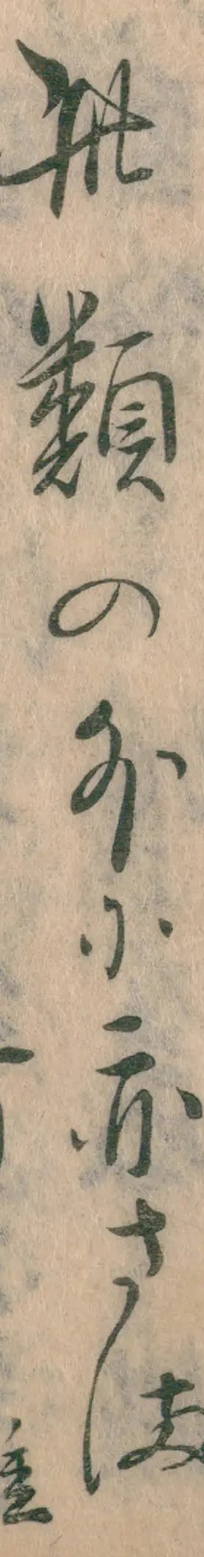此類の外に亦さま
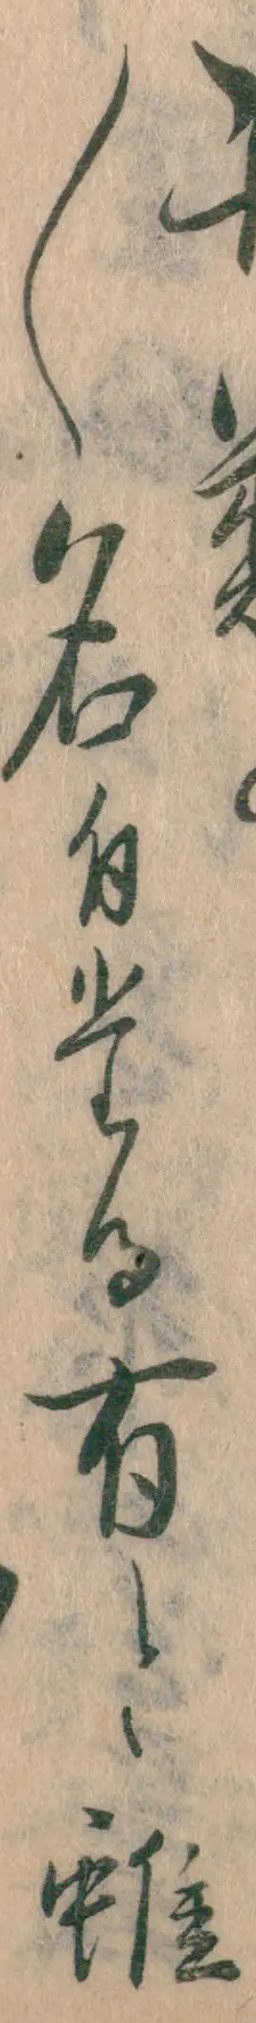〳〵名付たる有と雖
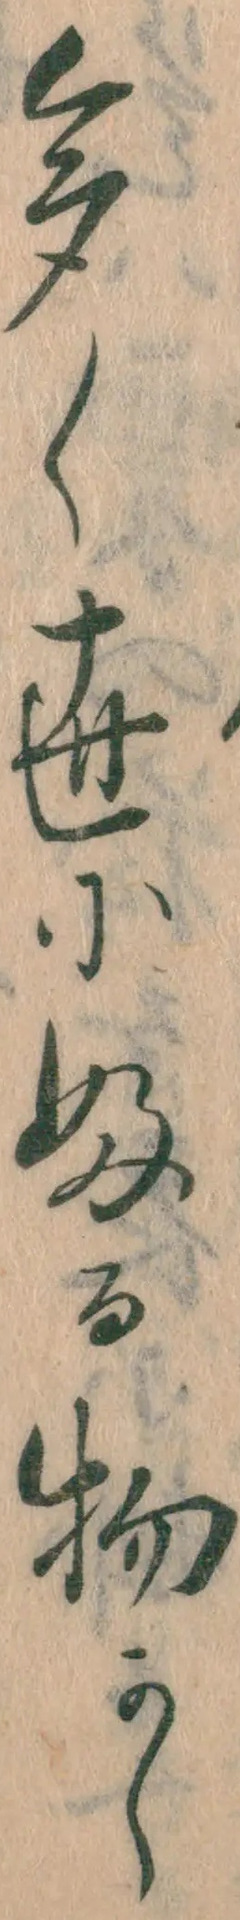多く世にふる物かく
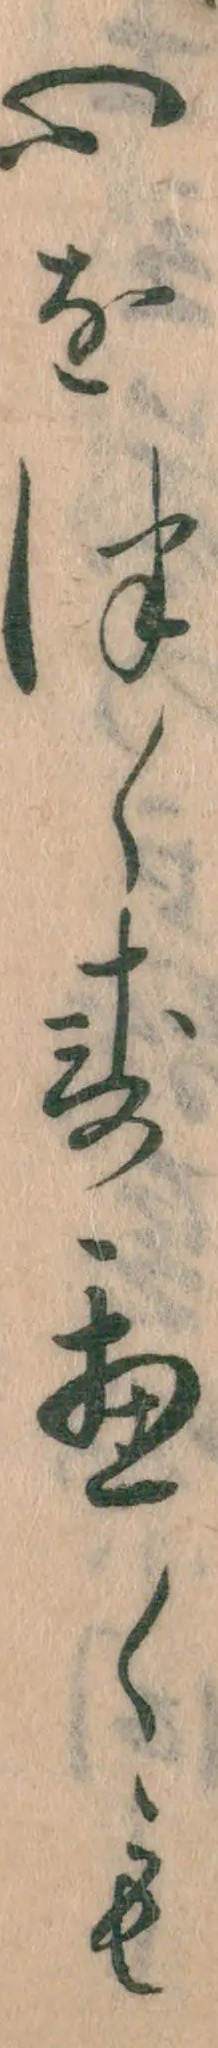心をつくすへくも
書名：豆腐百珍余録
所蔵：国立国会図書館 National Diet Library, JAPAN
